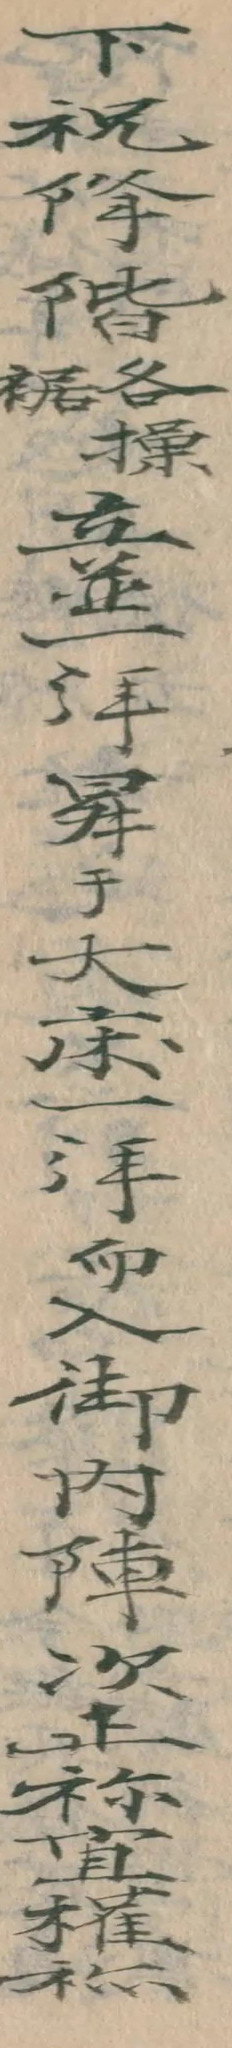下祝降階各操裾立並一拝昇于大床一拝而入御内陣次正祢宜権祢
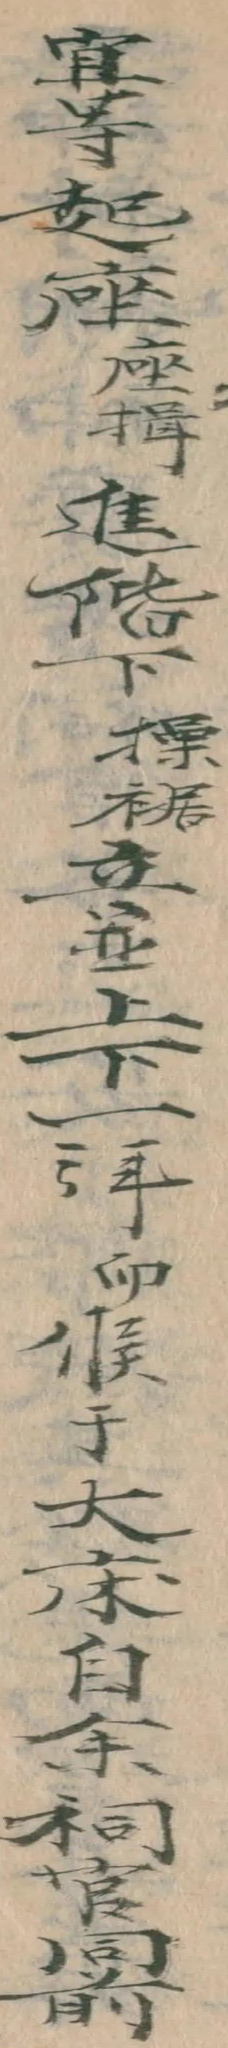宜等起座座揖進階下操裾立並上下一拝而候于大床自余祠官同前
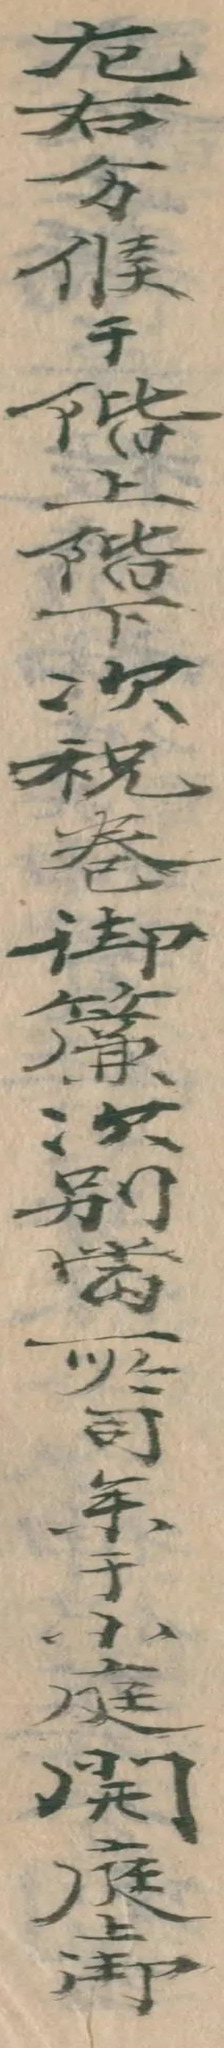左右分候于階上階下次祝巻御簾次別当所司参于小庭開庭上御

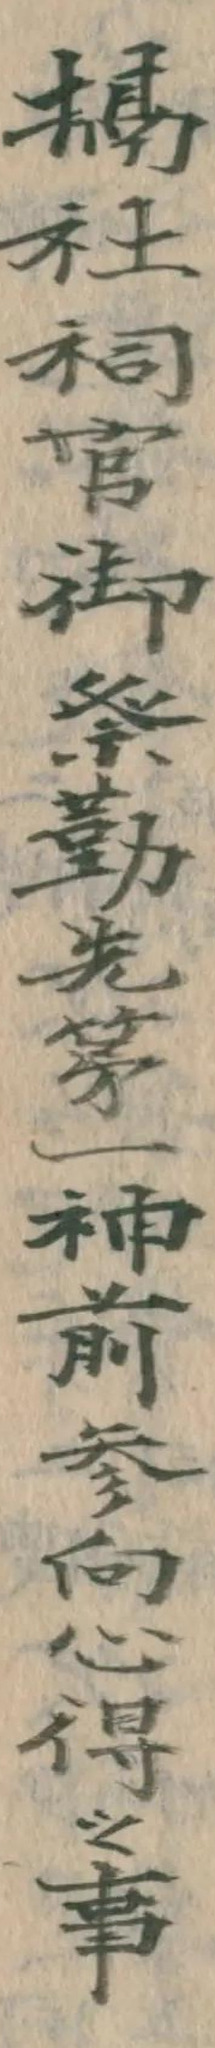摂社祠官御祭勤先第一神前参向心得之事
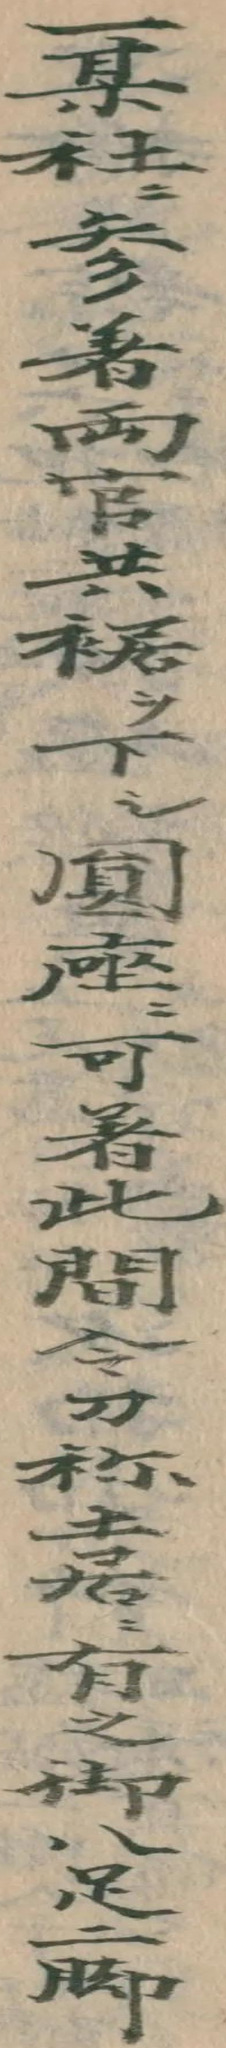一某社ニ参着両官共裾ヲ下シ円座ニ可着此間令刀祢土居ニ有之御八足三脚
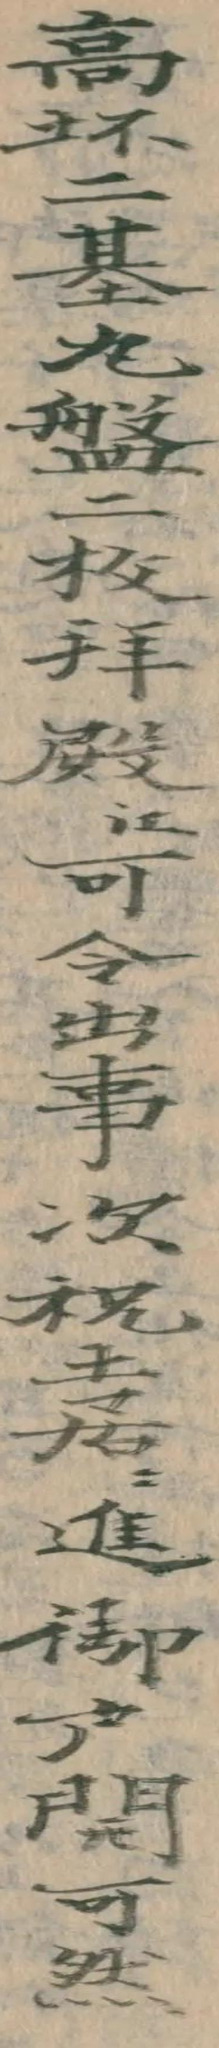高坏二基丸盤二枚拝殿江可令出事次祝土居ニ進御戸開可然
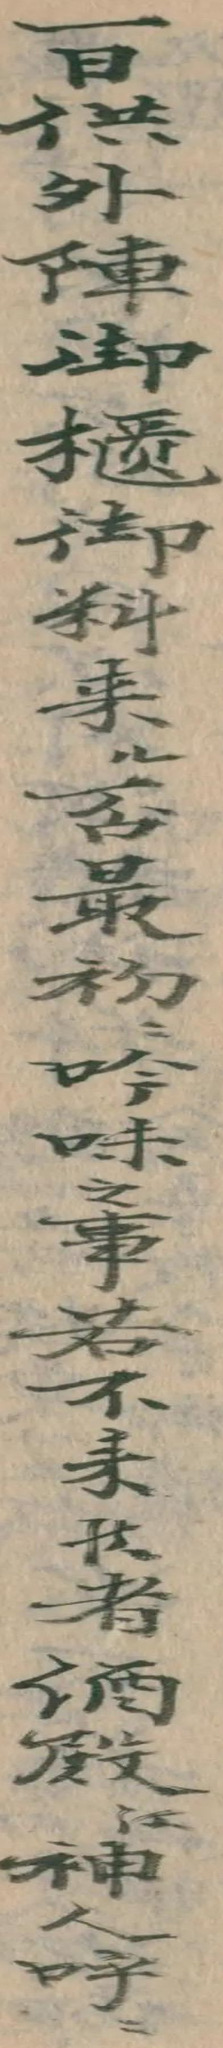一日供外陣御櫃御料来ル否最初ニ吟味之事若不来状者酒殿江神人呼ニ
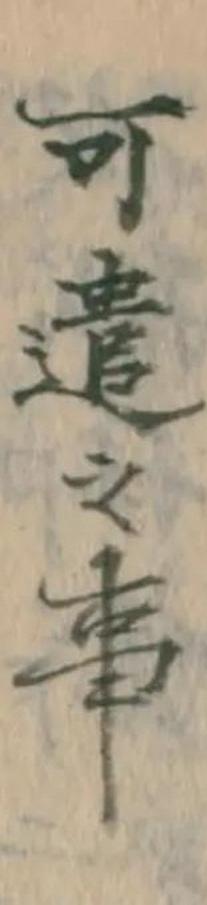可遣之事
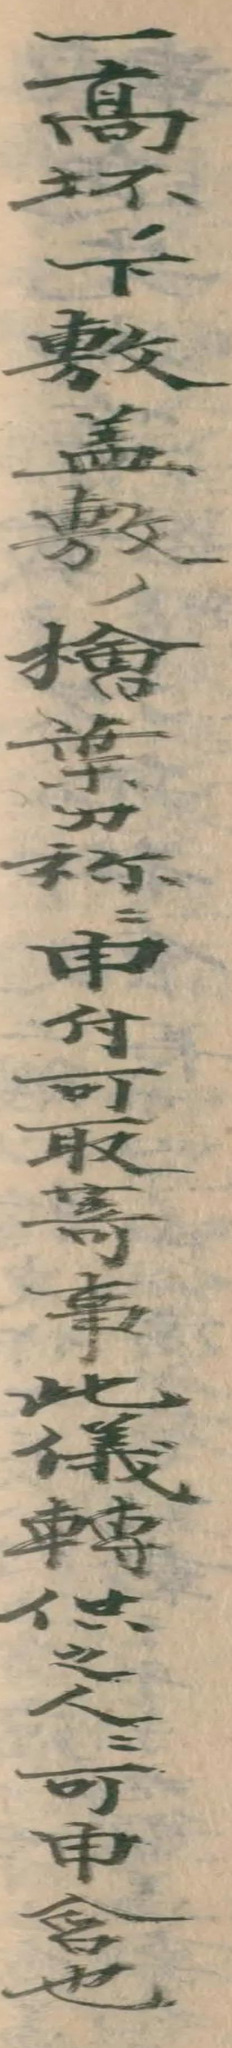一高坏ノ下敷盖敷ノ桧葉刀祢ニ申付可取寄事此儀転供之人ニ可申含也
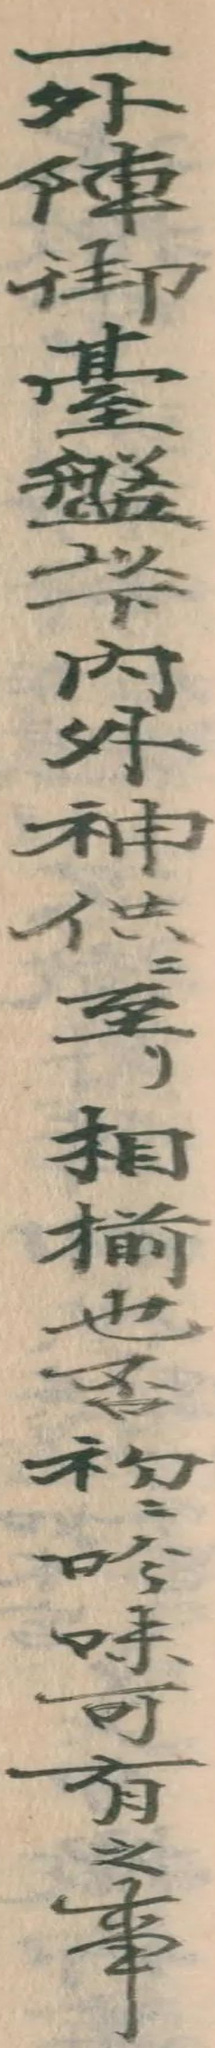一外陣御台盤以下内外神供ニ至リ相揃也否初ニ吟味可有之事
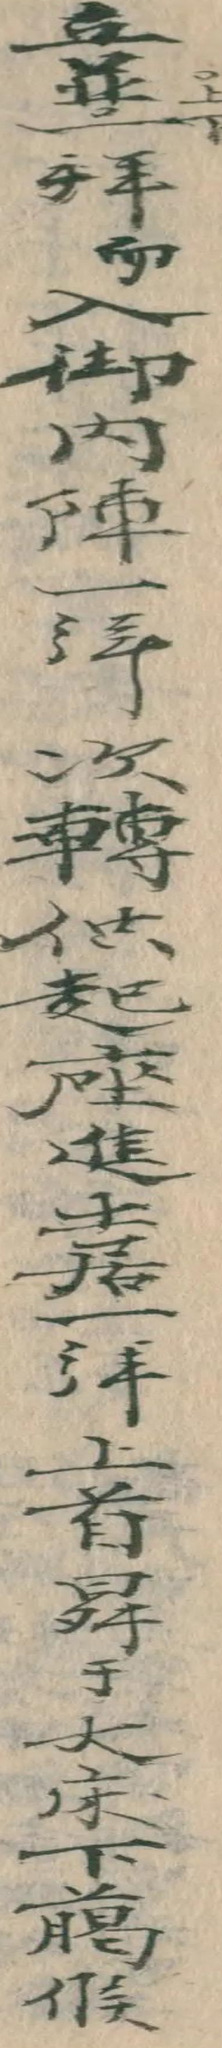立並◦一拝而入御内陣一拝次転供起座進土居一拝上首昇于大床下臈候
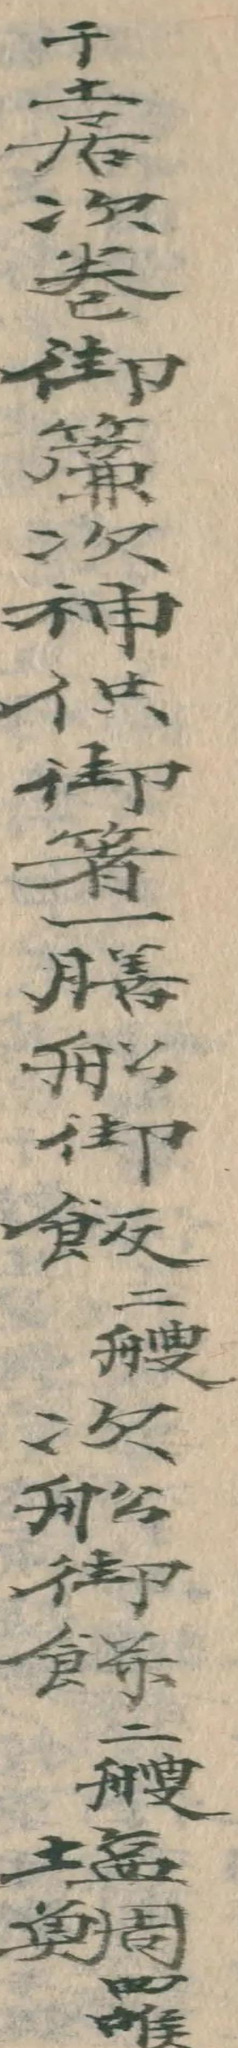于土居次巻御簾次神供御箸一膳船御飯二艘次船御餅二艘塩鯛四喉

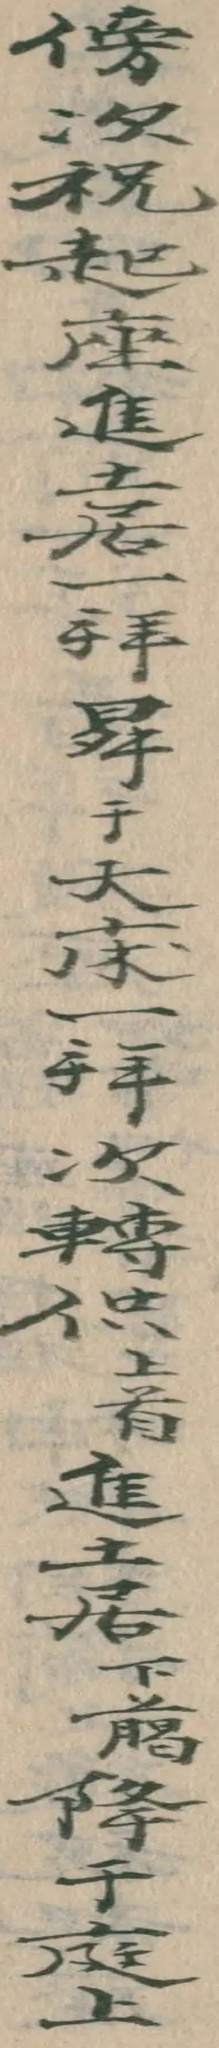傍次祝起座進土居一拝昇于大床一拝次転供上首進土居下臈降于庭上
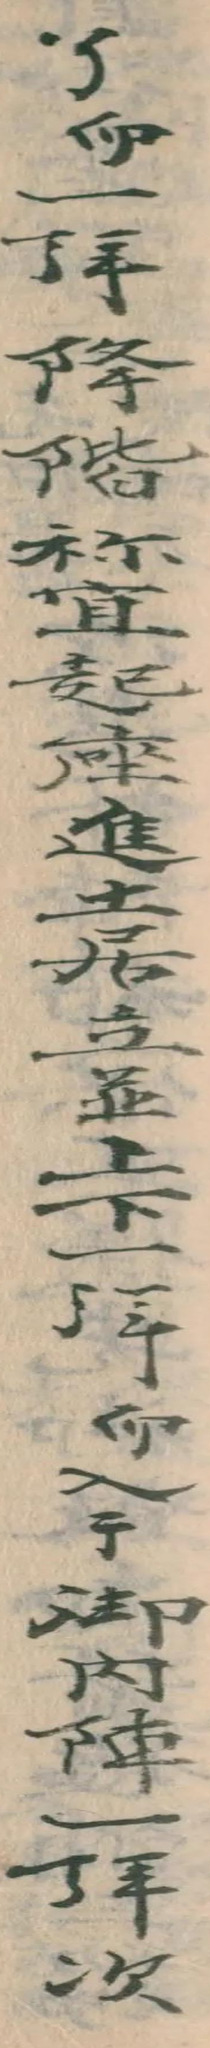了而一拝降階祢宜起座進土居立並上下一拝而入于御内陣一拝次
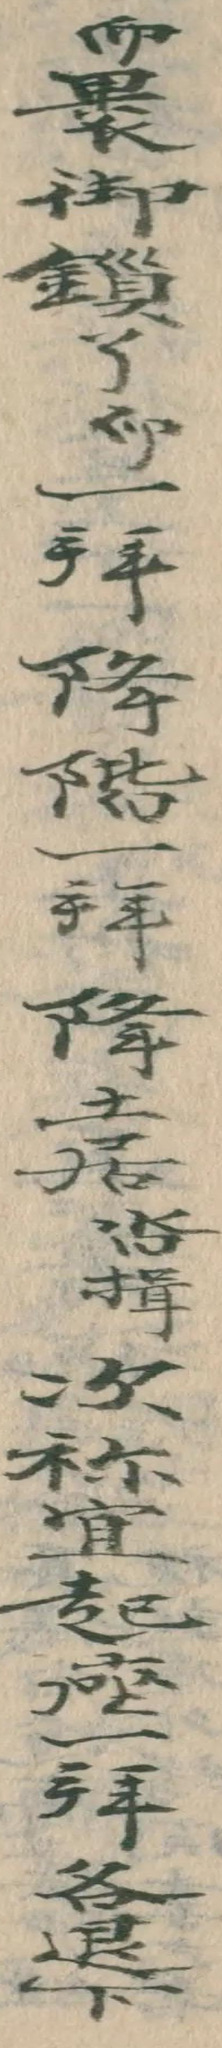而褁御鎖了而一拝降階一拝降土居沓揖次祢宜起座一拝各退下

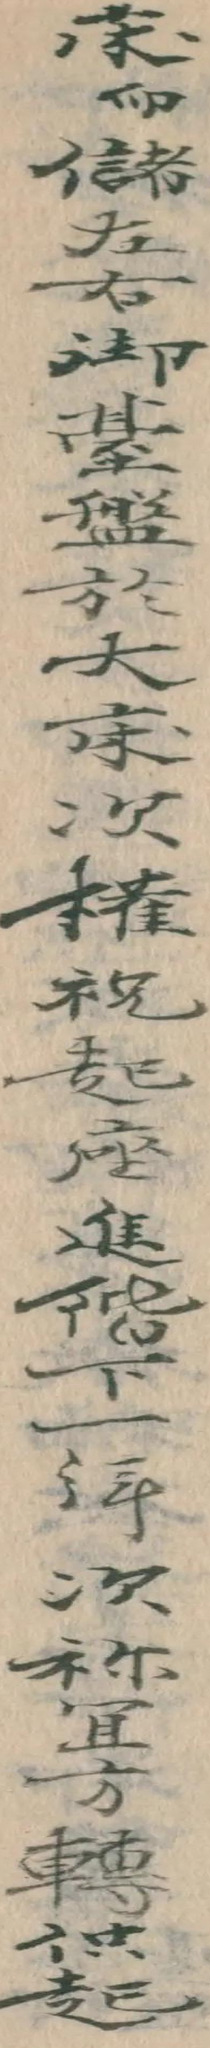床而儲左右御台盤於大床次権祝起座進階下一拝次祢宜方転供起
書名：賀茂社記録. 第9冊
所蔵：国立国会図書館 National Diet Library, JAPAN
